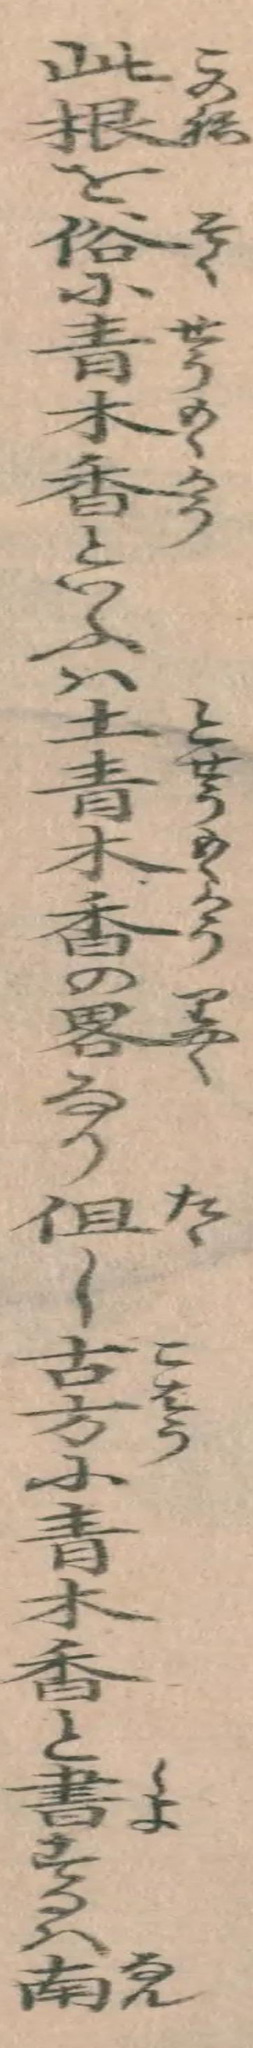此根を俗に青木香といふは土青木香の略なり但し古方に青木香と書するは南
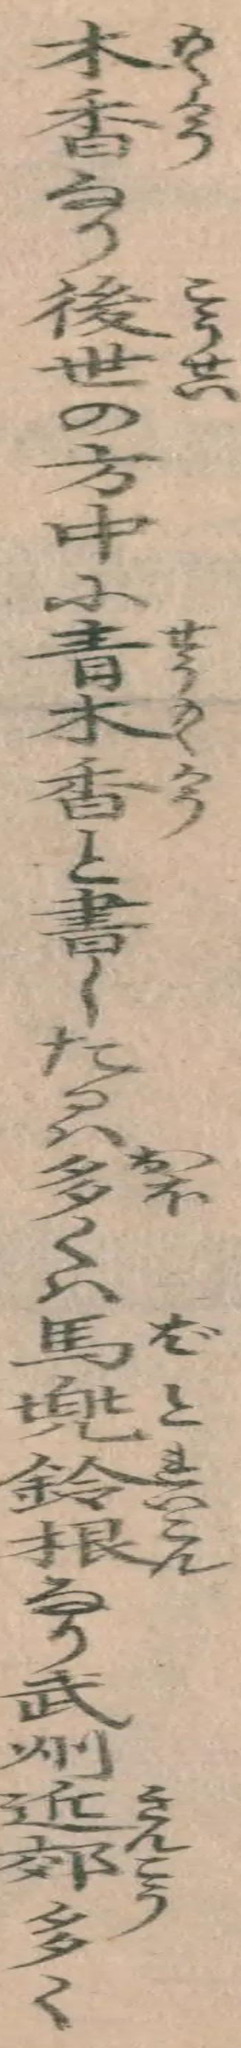木香なり後世の方中に青木香と書したるは多くは馬兜鈴根なり武州近郊多く
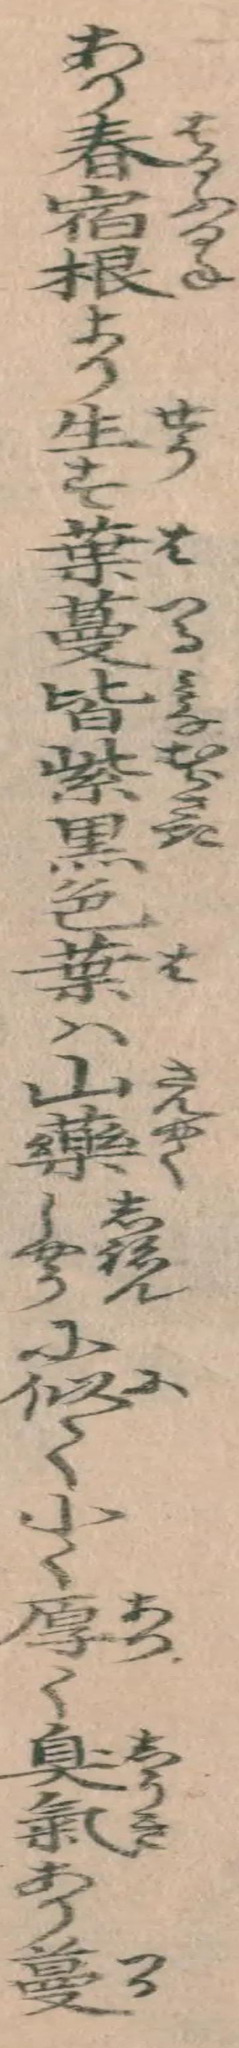あり春宿根より生す葉蔓皆紫黒色葉は山薬しねんしやうに似て小く厚く臭気あり蔓
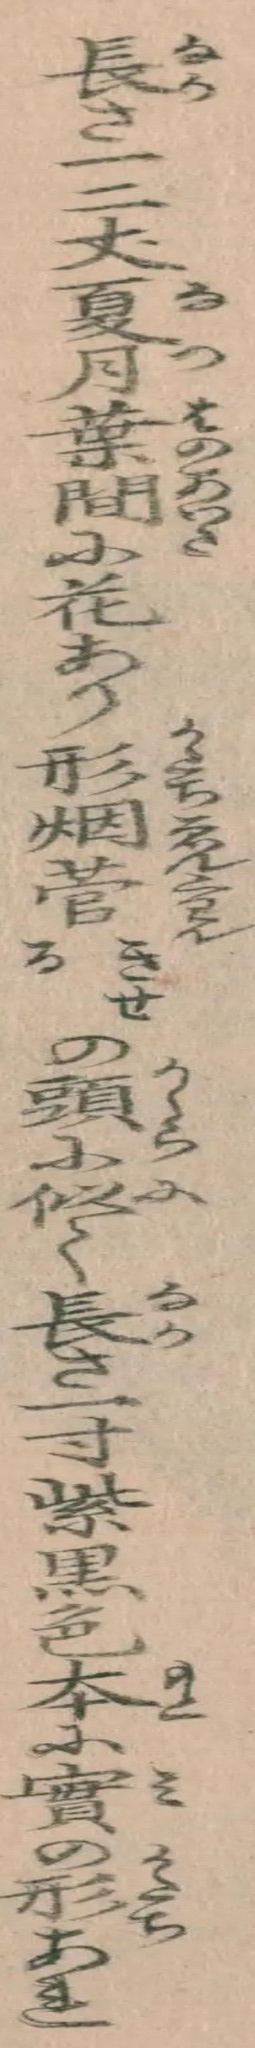長さ一二丈夏月葉間に花あり形烟菅きせるの頭に似て長さ一寸紫黒色本に実の形あれ
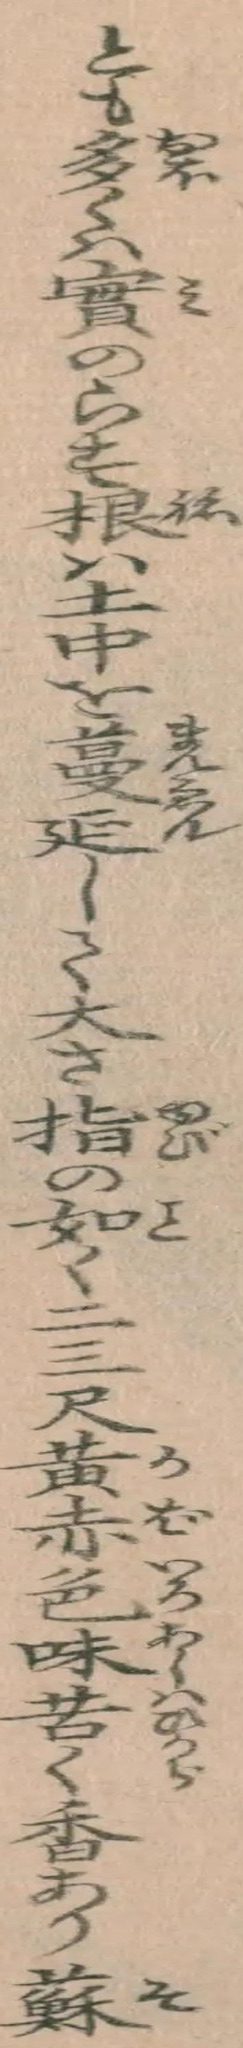とも多くは実のらす根は土中を蔓延して大さ指の如く二三尺黄赤色味苦く香あり蘇
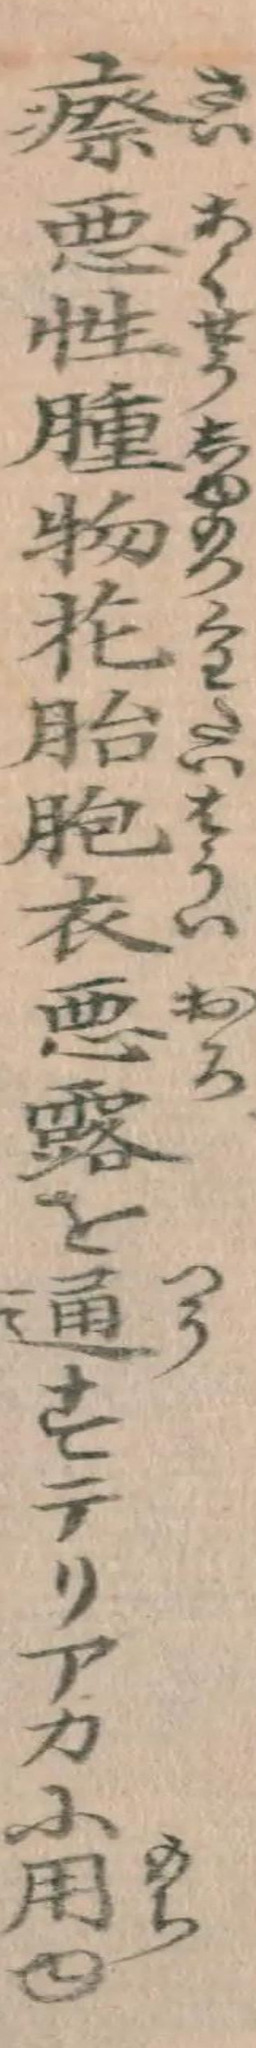瘵悪性腫物花胎胞衣悪露を通すテリアカに用ゆ

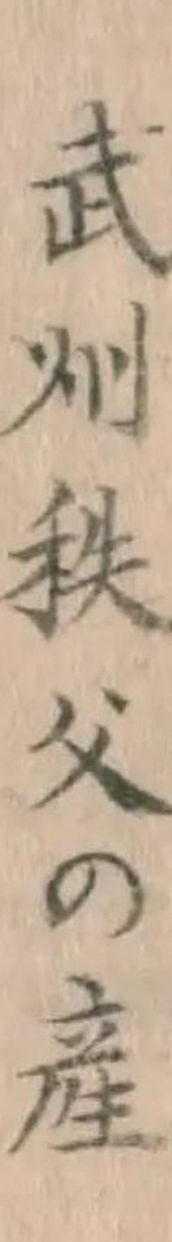武州秩父の産
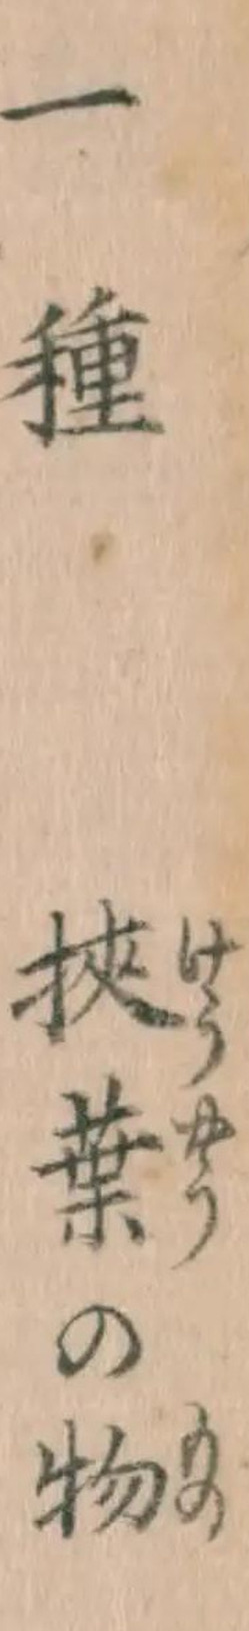一種挟葉の物
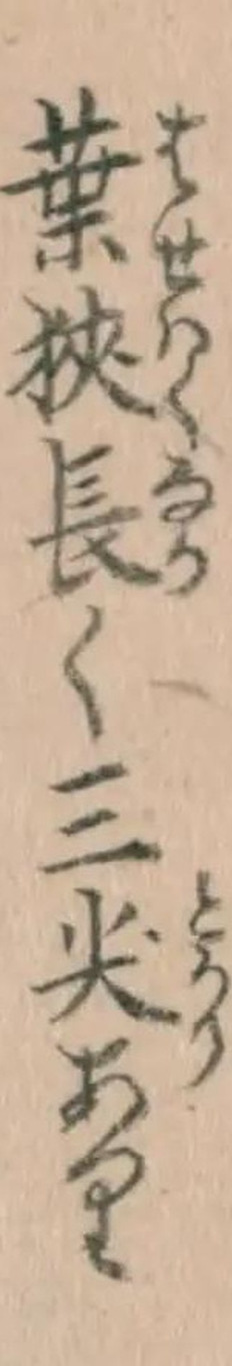葉狭長く三尖あり
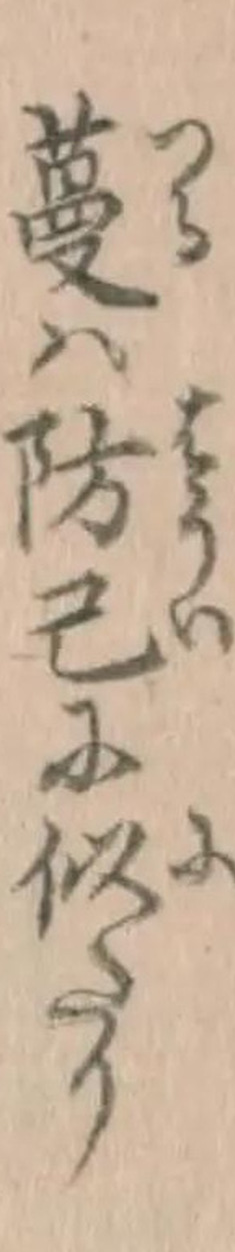蔓は防己に似たり

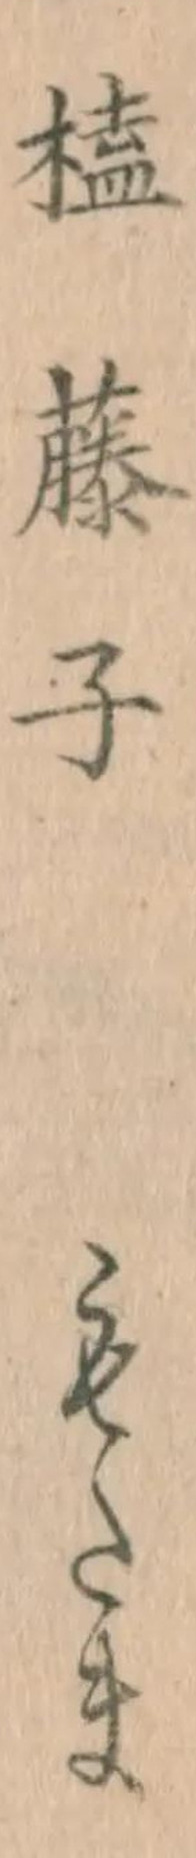榼藤子もたま
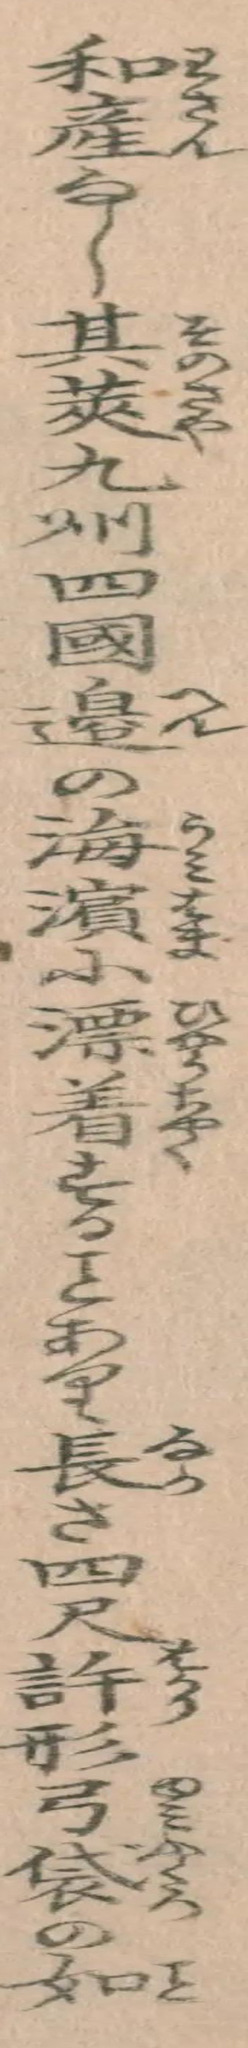和産なし其莢九州四国辺の海浜に漂着することあり長さ四尺許形弓袋の如
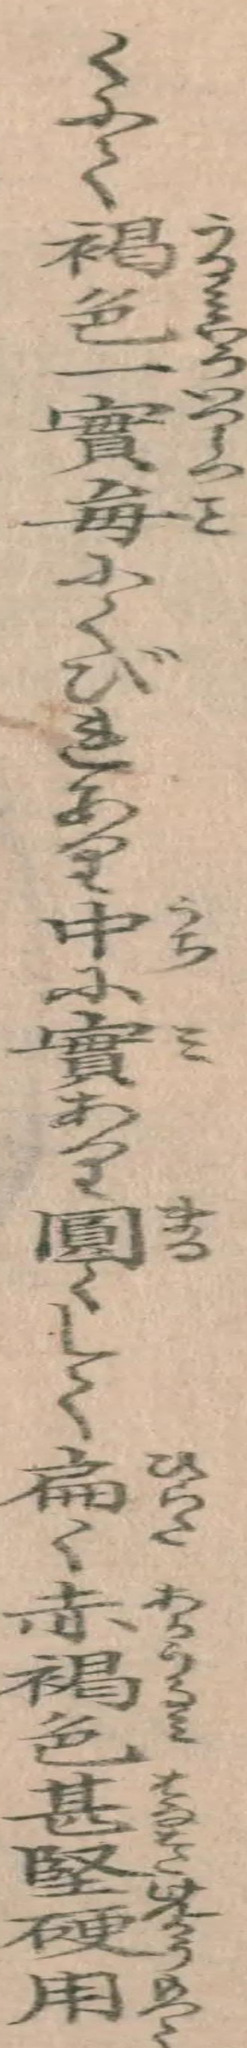くにて褐色一実毎にくびれあり中に実あり円くして扁く赤褐色甚堅硬用
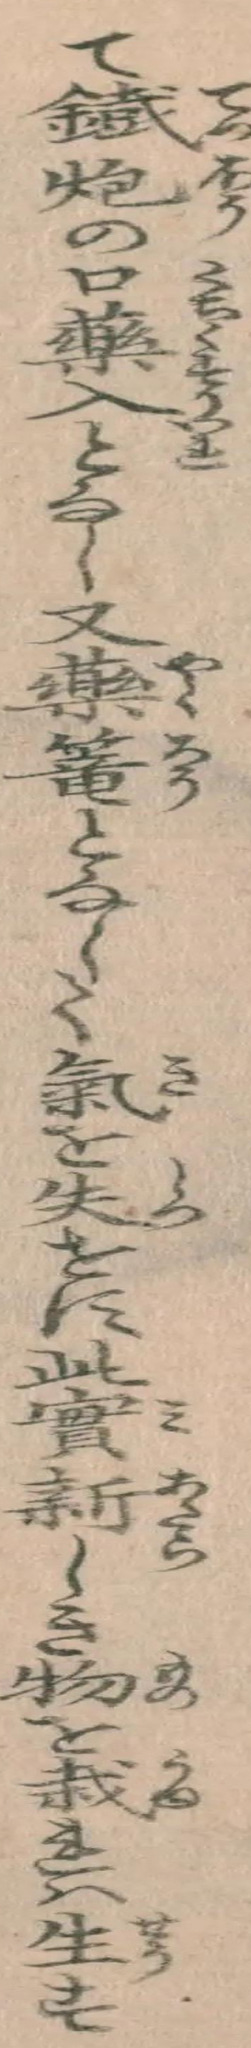て鉄炮の口薬入となし又薬籠となして気を失せす此実新しき物を栽れは生す
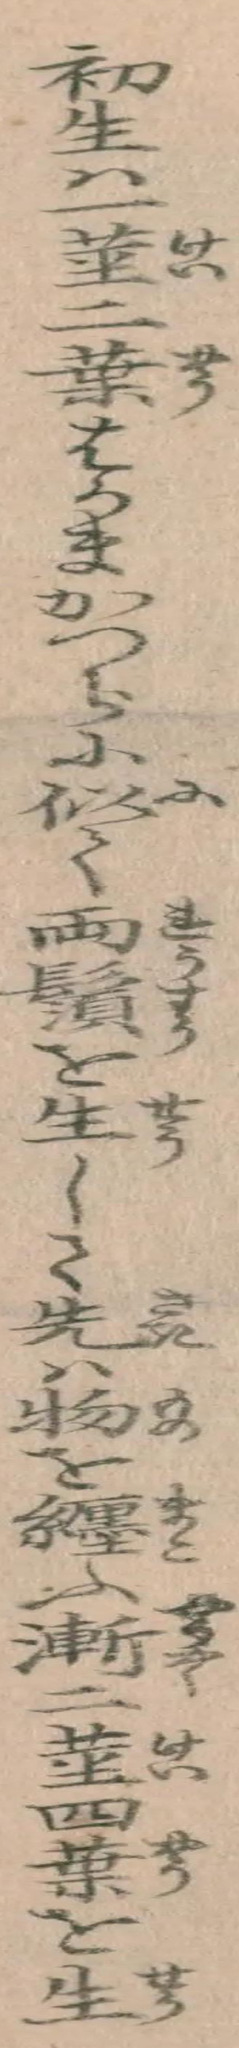初生は一茎二葉はかまかつらに似て両鬚を生して先は物を纏ふ漸二茎四葉を生
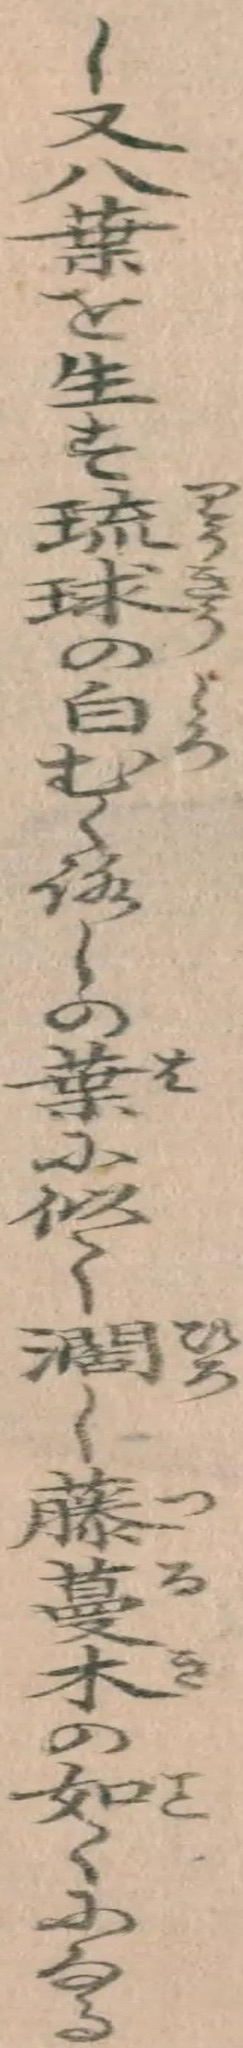し又八葉を生す琉球の白むくろしの葉に似て闊し藤蔓木の如くになる
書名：本草図譜. 巻25-27
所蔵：国立国会図書館 National Diet Library, JAPAN
